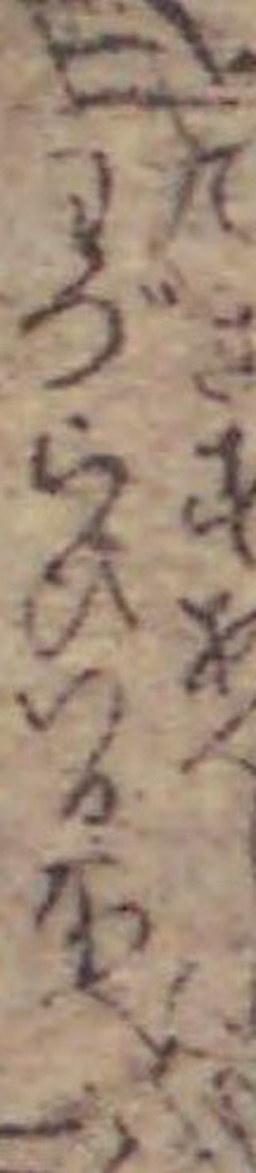わづらひいる所へ
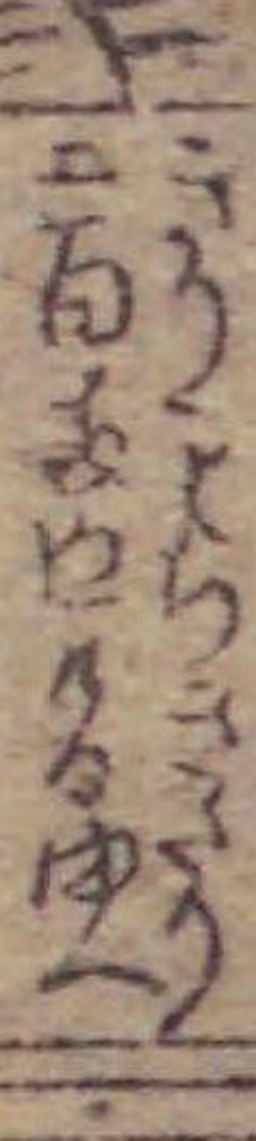二百両かしけるゆへ
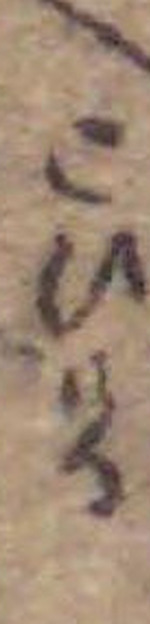こひける
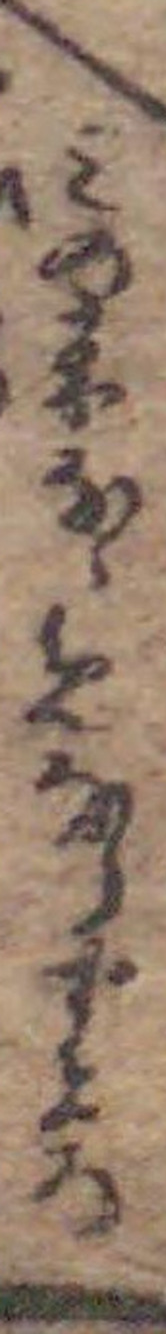みの米なゝめならずよろ

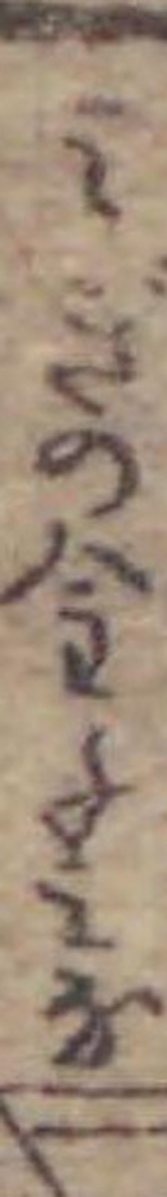みぎの金子みな
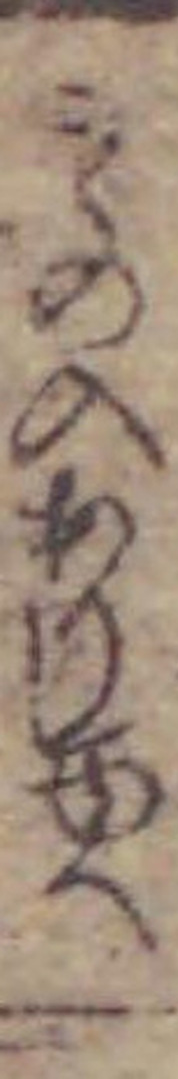もの入ありしゆへ
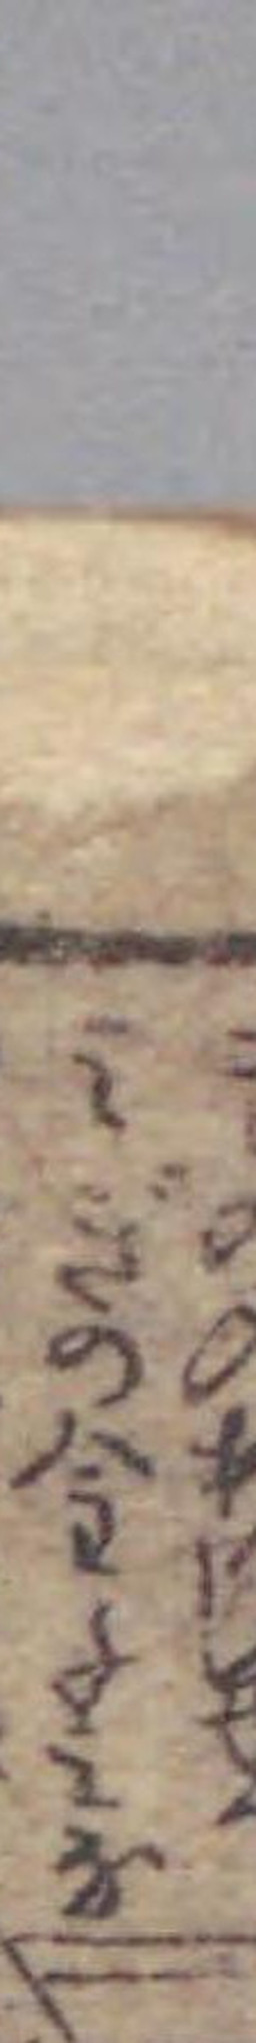みぎの金子みな
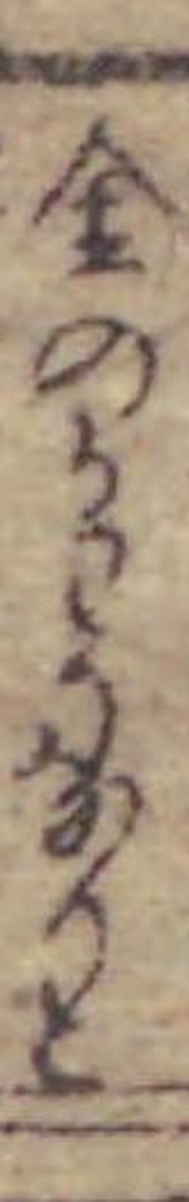金のかわりなりとりふ
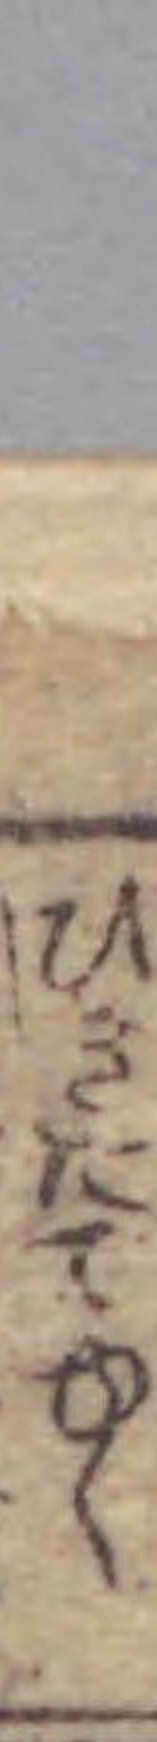ひきたてゆく
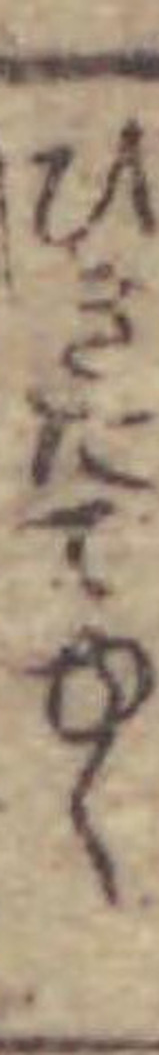ひきたてゆく
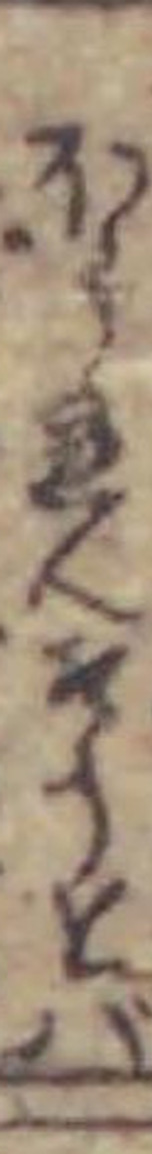ほうれんそうひめ
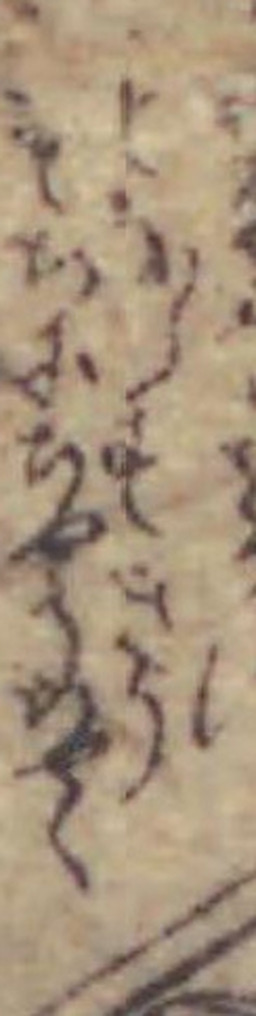もちにちやうちやく
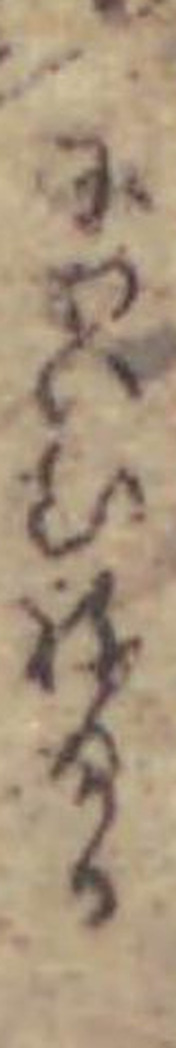にあいむねんかる
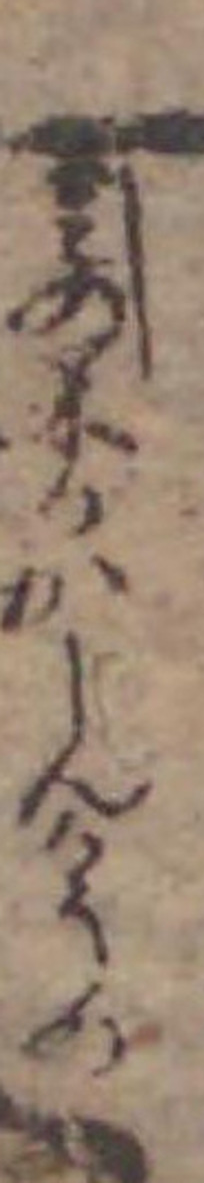〽みの米がかしんかうの
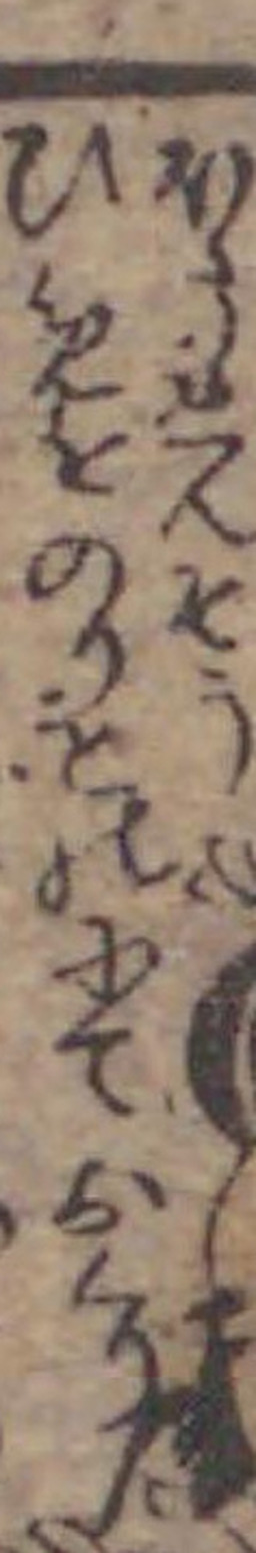ひめをのりものにておくり
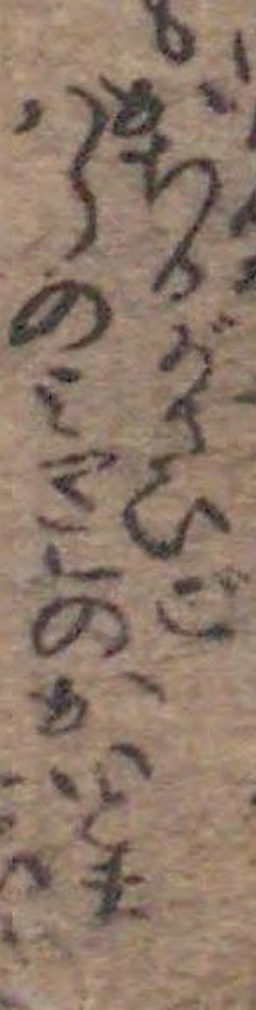はらのみやこのおいとま
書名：腹京師食物合戦 : 2巻
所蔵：国立国会図書館 National Diet Library, JAPAN
